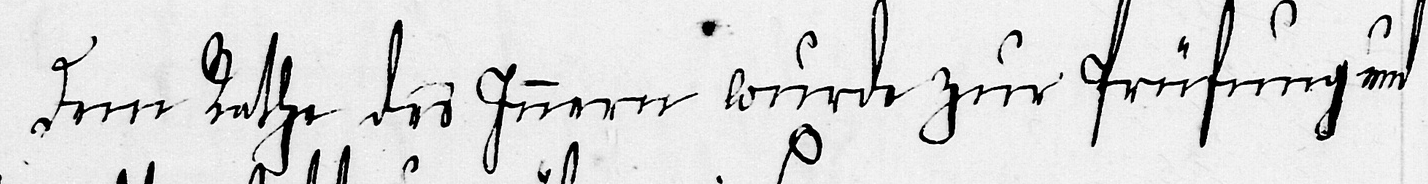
Dem Rathe des Innern wurde zur Prüfung und
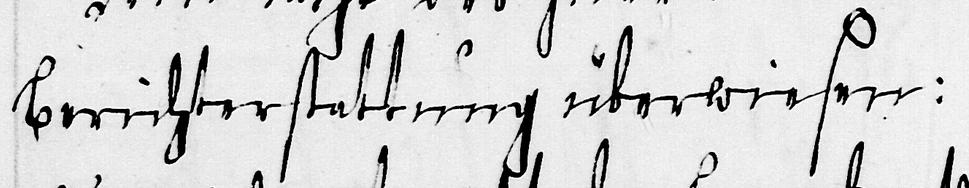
Berichterstattung überwiesen:
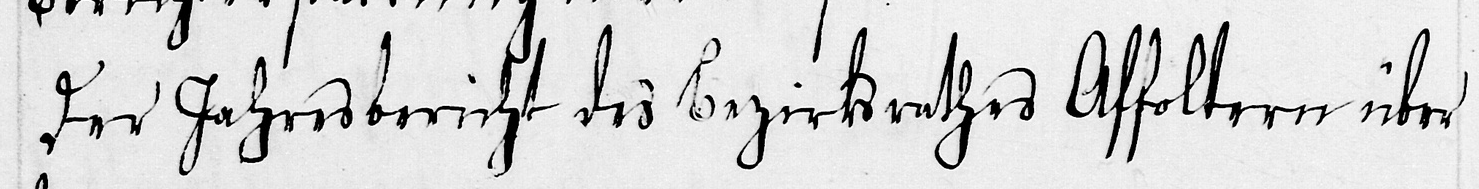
Der Jahresbericht des Bezirksrathes Affoltern über
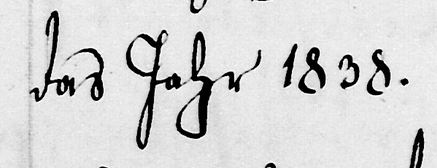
das Jahr 1838.
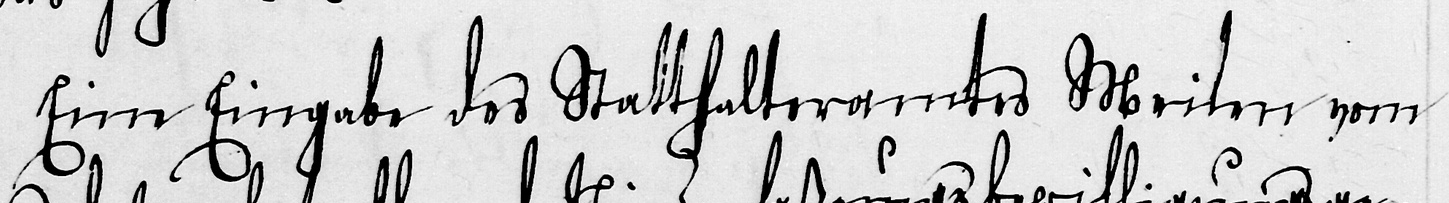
Eine Eingabe des Statthalteramtes Meilen vom
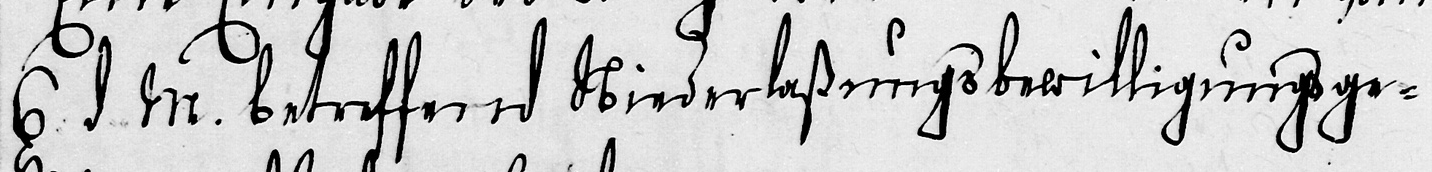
6. d. M. betreffend Niederlaßungsbewilligungsge¬
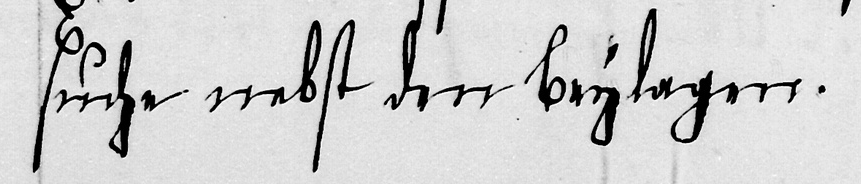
suche nebst den Beylagen.
